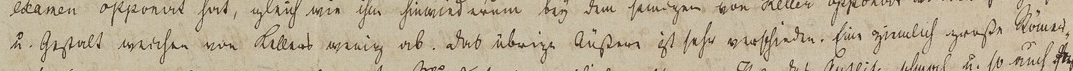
u. Gestalt weichen von Kellers wenig ab. Das übrige Äußere ist sehr verschieden. Eine ziemlich große Römer-
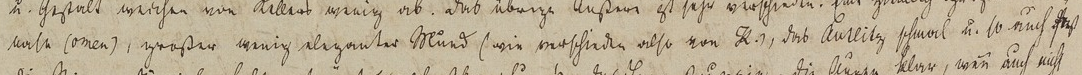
nase (omen), großer wenig eleganter Mund (wie verschieden also von K.), das Antlitz schmal u. so auch sonst
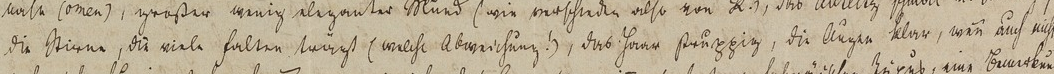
die Stirne, die viele Falten trägt (welche Abweichung!), das Haar struppig, die Augen klar, wenn auch nicht
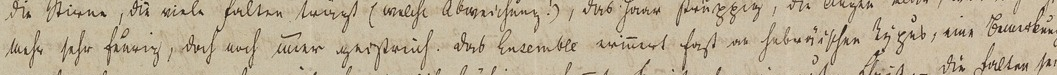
mehr sehr feurig, doch noch immer geistreich. Das Ensemble erinnert fast an hebräischen Typus, eine Bemerkung
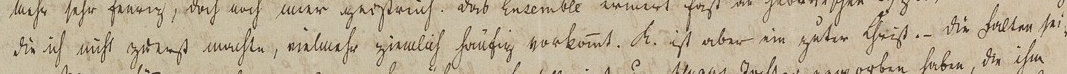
die ich nicht zuerst machte, vielmehr ziemlich häufig vorkommt. R. ist aber ein guter Christ. – Die Falten sei-
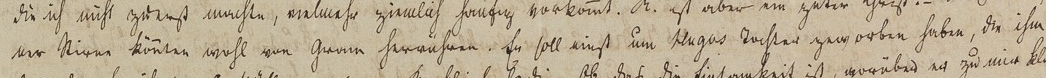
ner Stirne könnten wohl von Gram herrühren. Er soll einst um Hugos Tochter geworben haben, die ihm
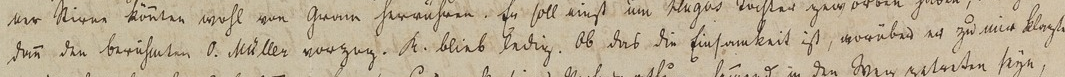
dann den berühmten O. Müller vorzog. R. blieb ledig. Ob das die Einsamkeit ist, worüber er zu mir klagte,
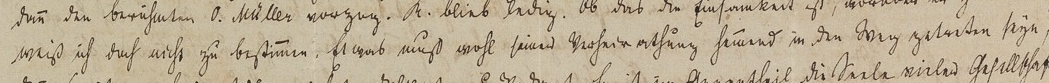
weiß ich doch nicht zu bestimmen. Etwas muß wohl seiner Verheirathung hemmend in den Weg getreten seyn,
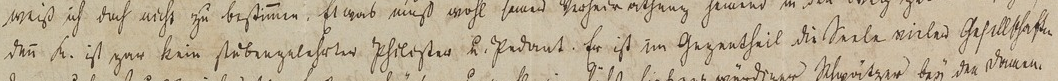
denn R. ist gar kein stubengelehrter Philister u. Pedant. Er ist im Gegentheil die Seele vieler Gesellschaften
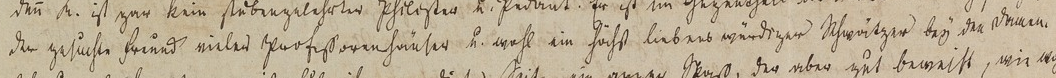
der gesuchte Freund vieler Professorenhäuser u. wohl ein höchst liebenswürdiger Schwätzer bey den Damen.
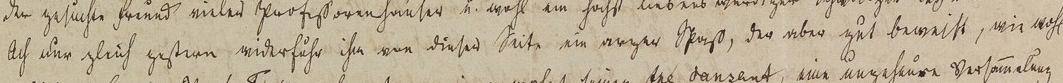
Ach nur gleich gestern widerfuhr ihm von dieser Seite ein arger Spaß, der aber gut beweist, wie wohl
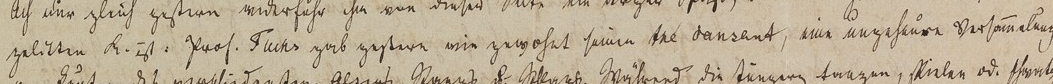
gelitten R. ist: Prof. Fuchs gab gestern wie gewohnt seinen thé dansant, eine ungeheure Versammlung
